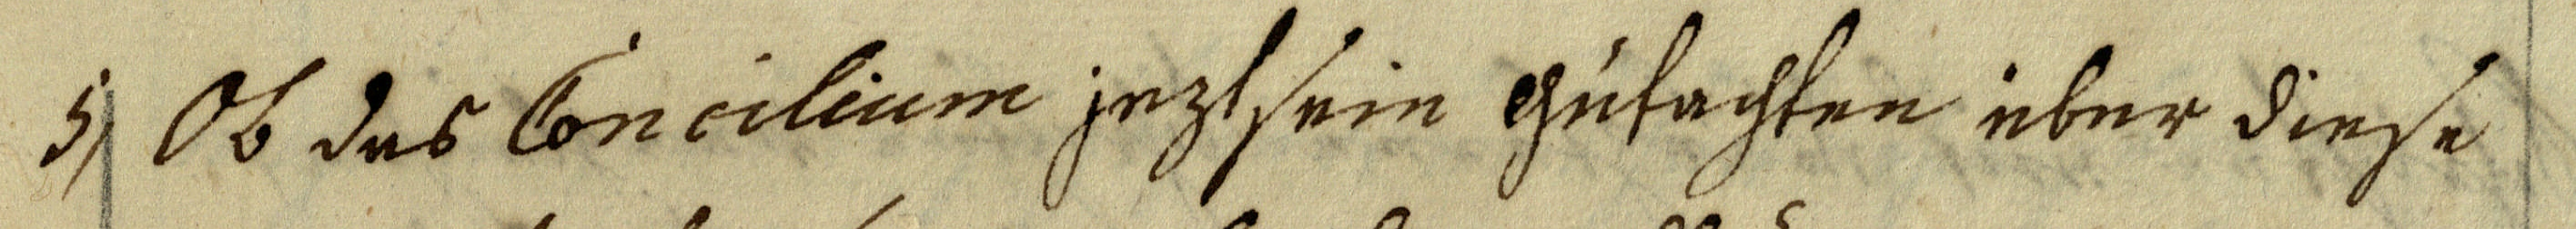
5, Ob das Concilium jezt sein Gutachten über diese
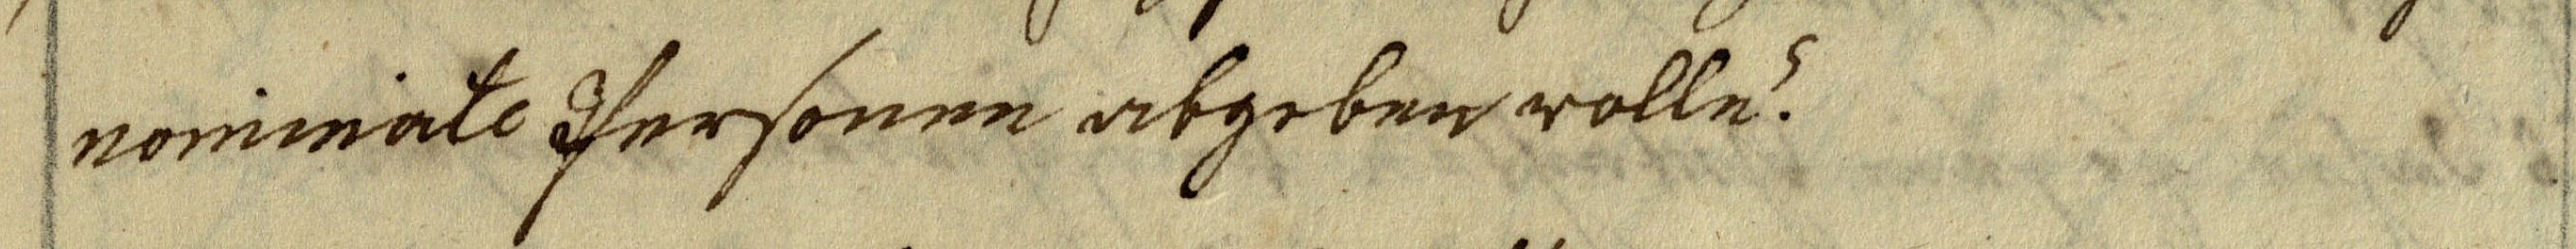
nominirte Personen abgeben wolle?
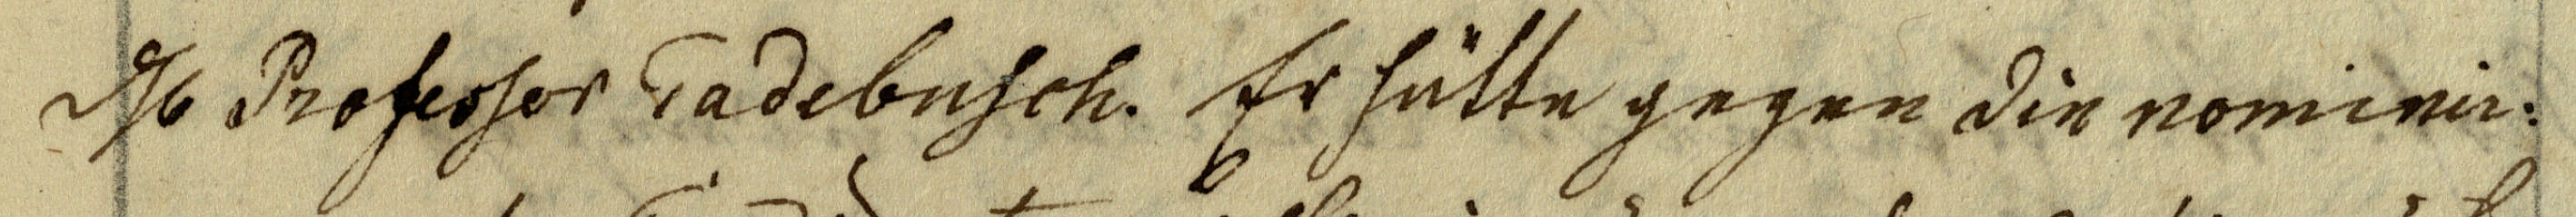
dh Professor Gadebusch. Er hätte gegen die nominir¬
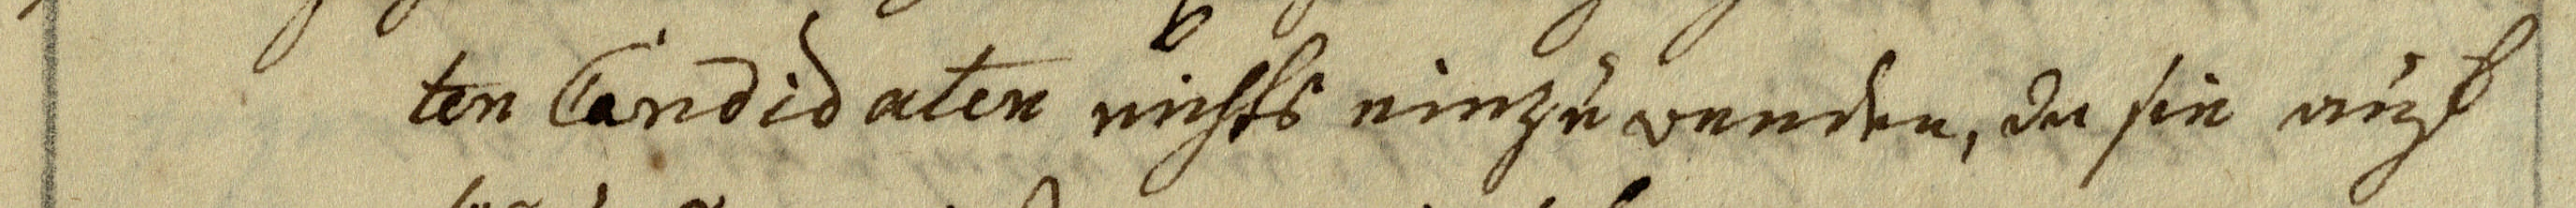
ten Candidaten nichts einzuwenden, da sie auf
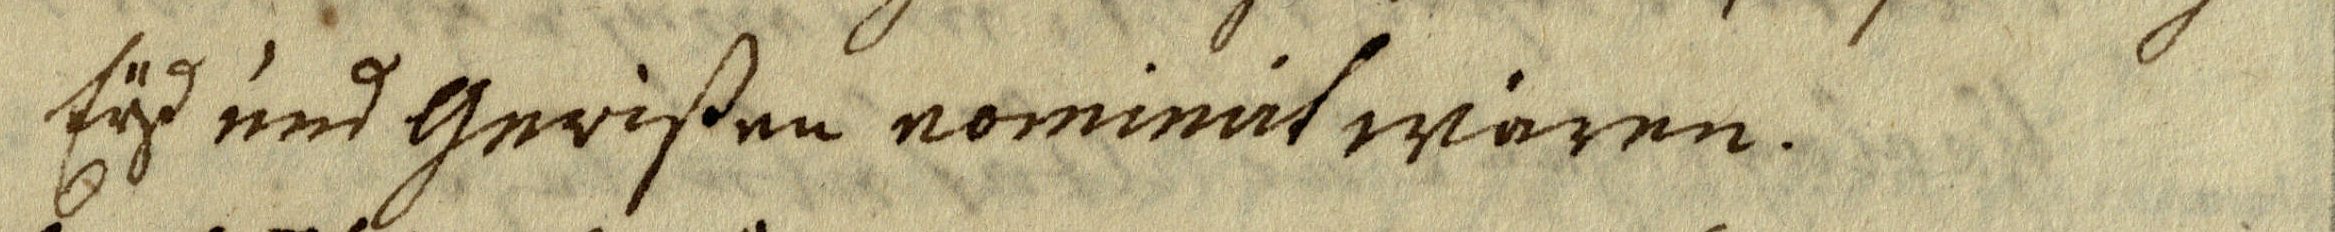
Eÿd und Gewißen nominirt wären.
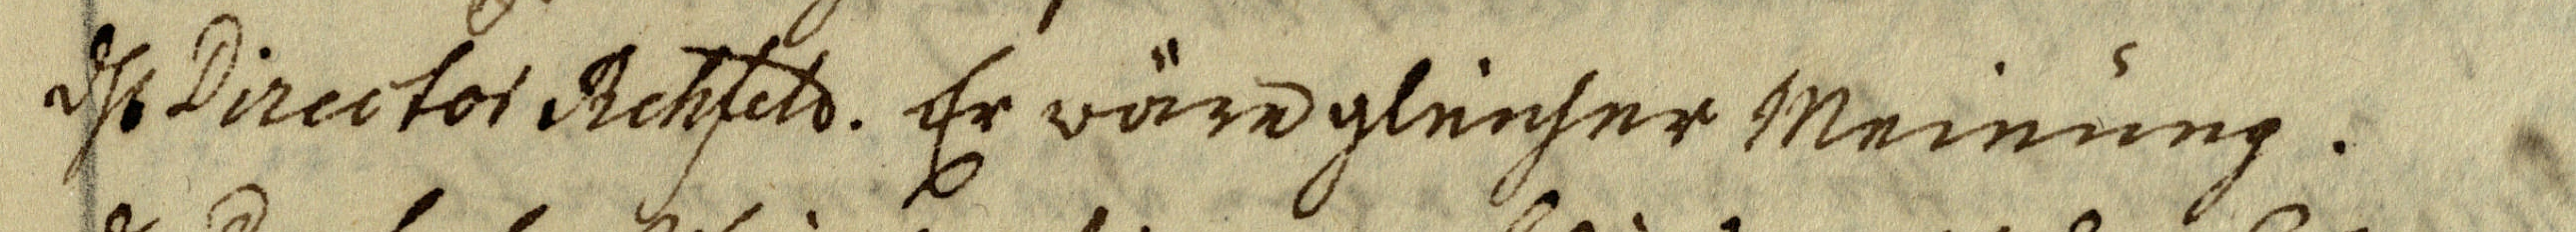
dh Director Rehfeld. Er wäre gleicher Meinung.
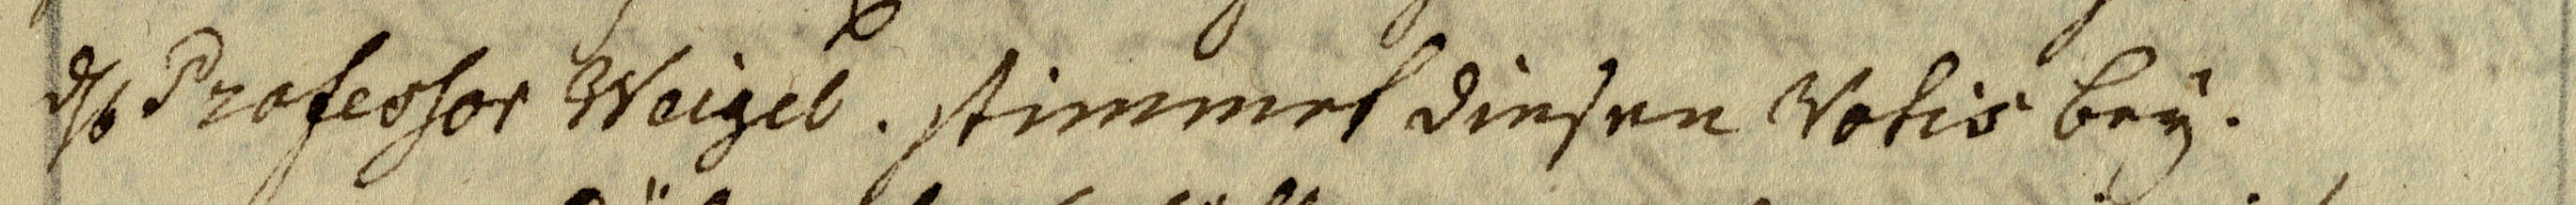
dh Professor Weigel. stimmet diesen Votis beÿ.
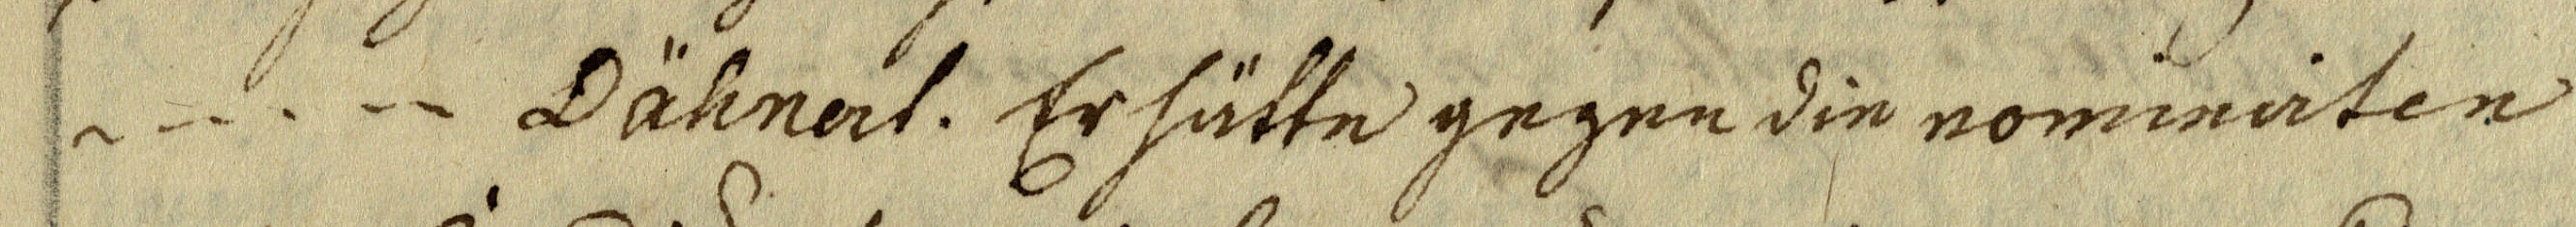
Dähnert. Er hätte gegen die nominirten
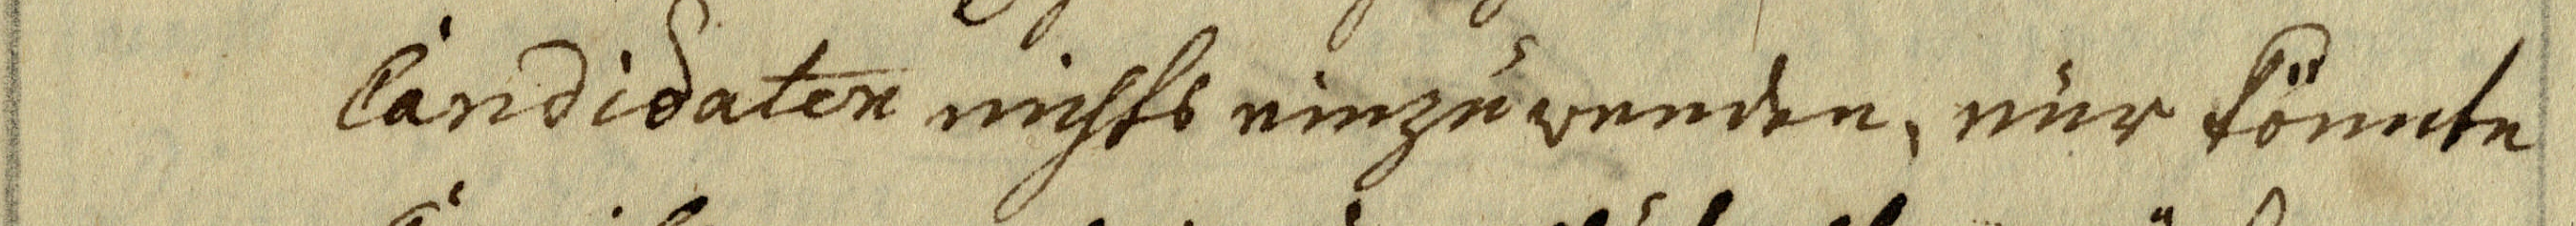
Candiadten nichts einzuwenden, nur könnte
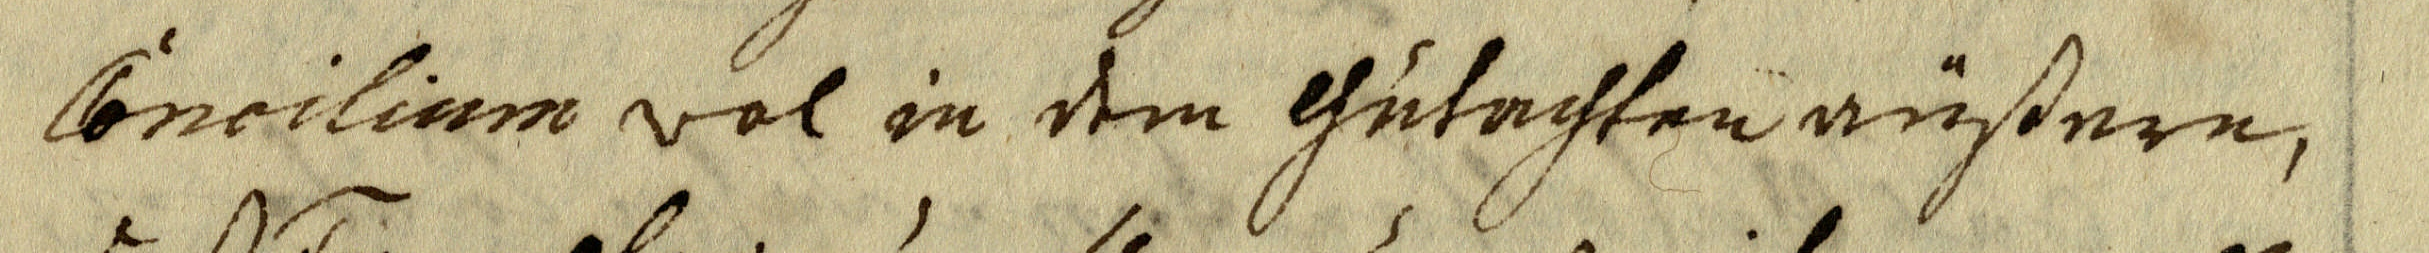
Concilium wol in dem Gutachten äußern,
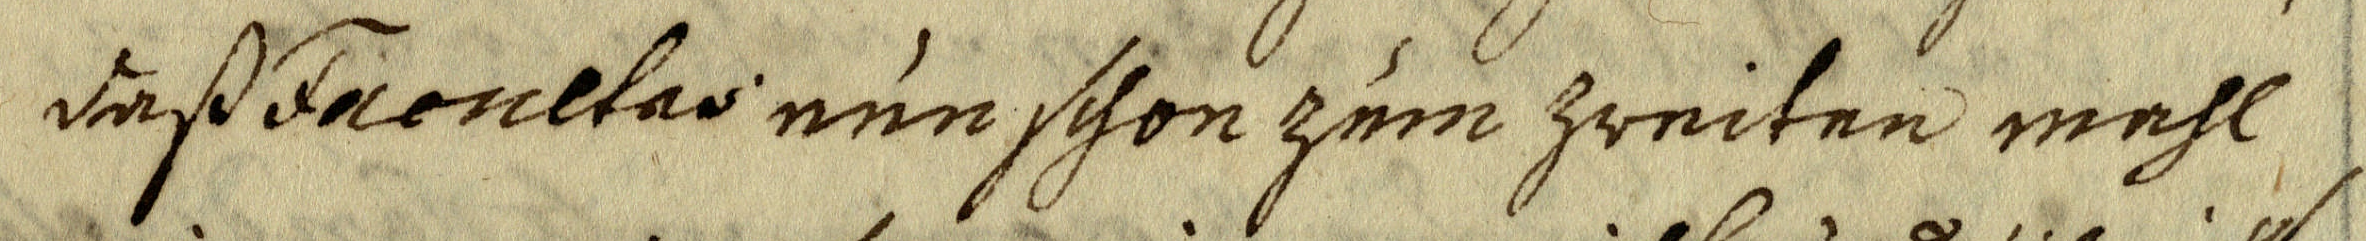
daß Facultas nun schon zum zweiten mahl
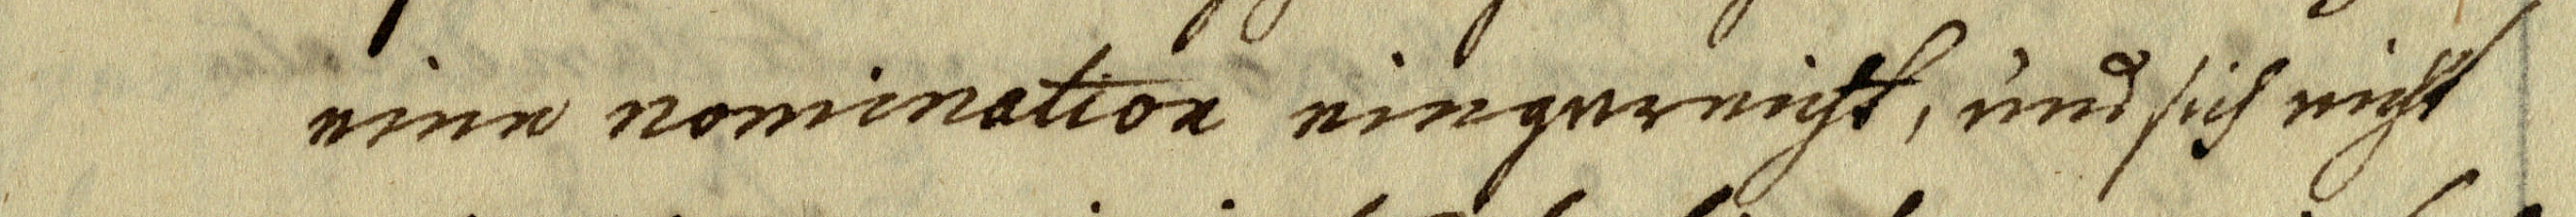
eine nomination eingereicht, und sich nicht
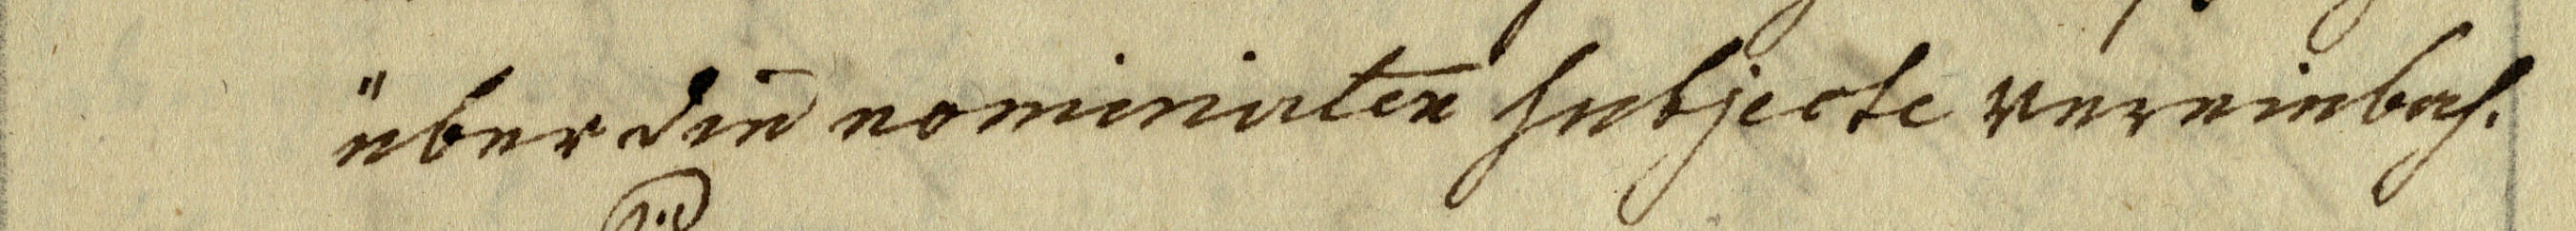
über die nominirten subjecte vereinbah¬
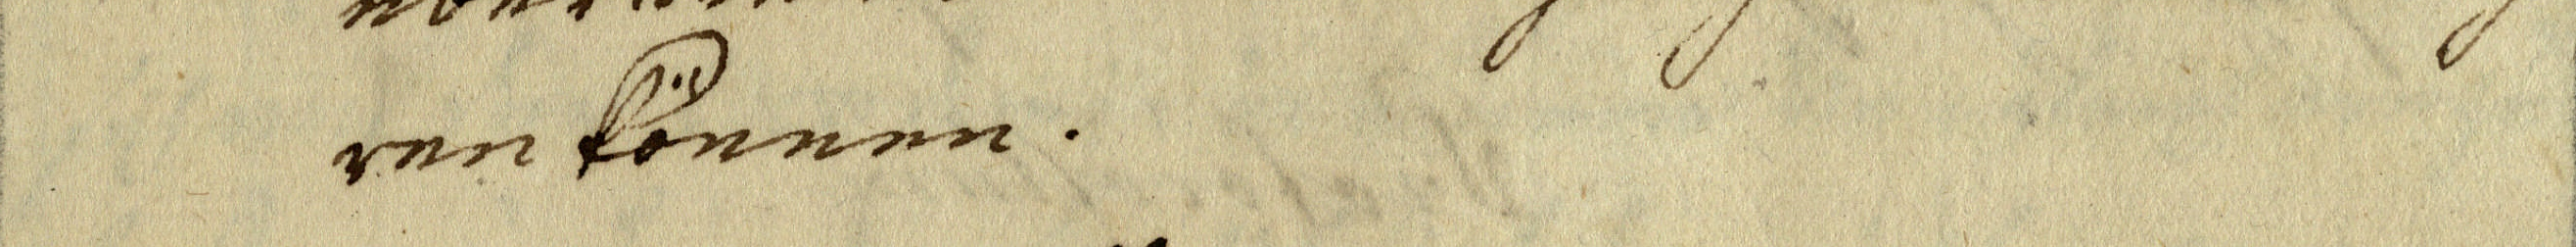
ren können.
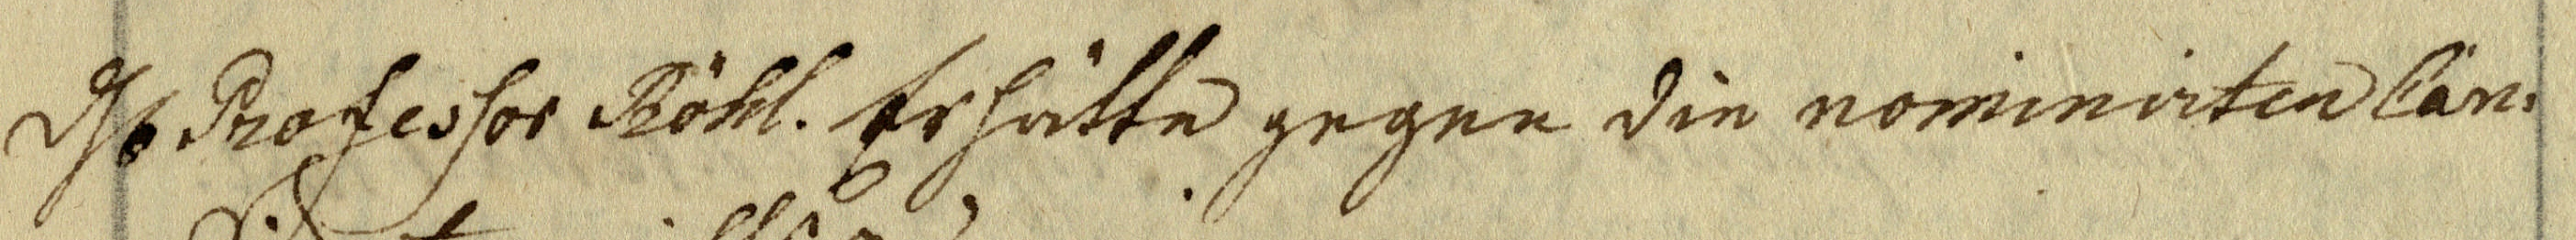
dh. Professor Röhl. Er hätte gegen die nominirten Can¬
